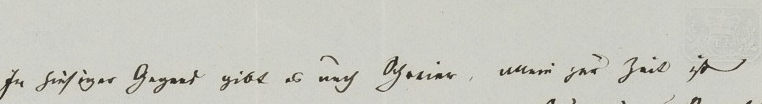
In hiesiger Gegend gibt es auch Schreier, allein zur Zeit ist
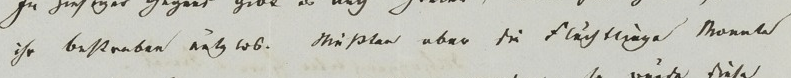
ihr Bestreben nutzlos. Müßten aber die Flüchtlinge Monate
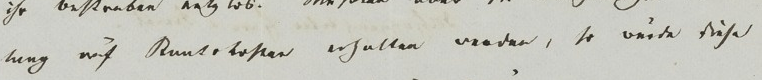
lang auf Staatskosten erhalten werden, so würde diese
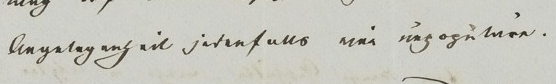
Angelegenheit jedenfalls eine unpopuläre.
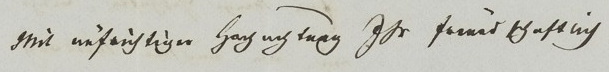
Mit aufrichtiger Hochachtung Ihr freundschaftlich
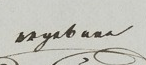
ergebener
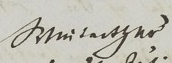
Winterthur
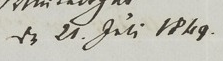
den 21. Juli 1849.
